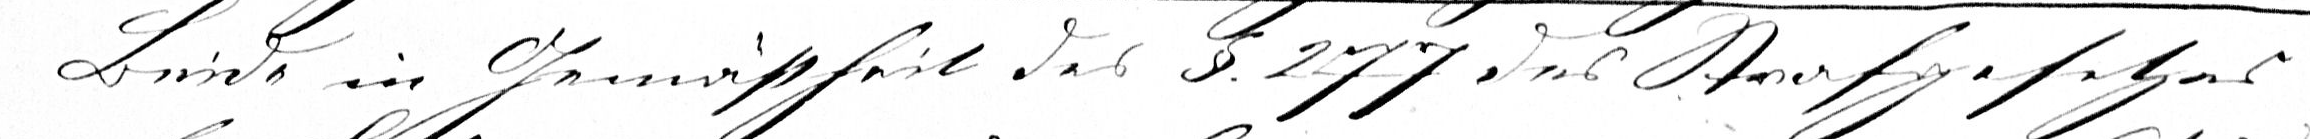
Beide in Gemäßheit des §. 277 des Strafgesetzes
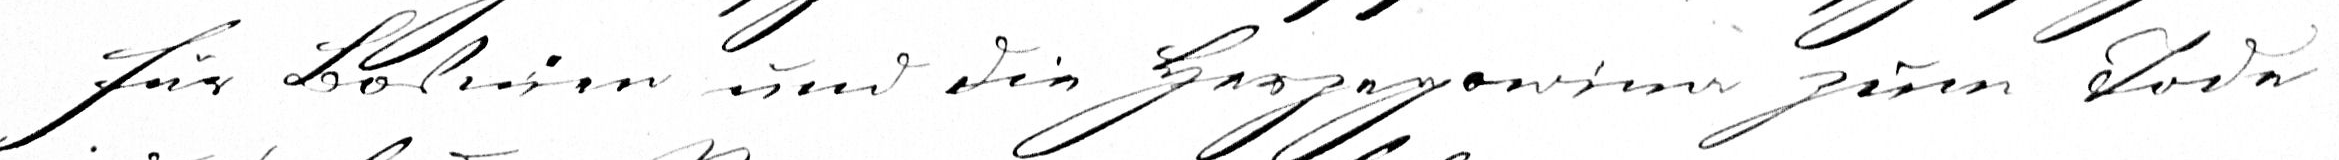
für Boswien und die Herzegowina zum Tode
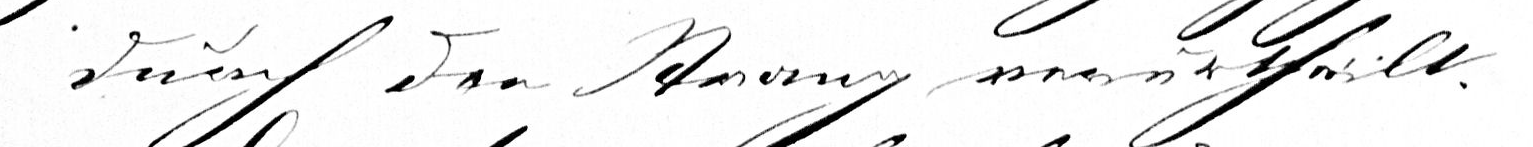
durch den Strang verurtheilt.
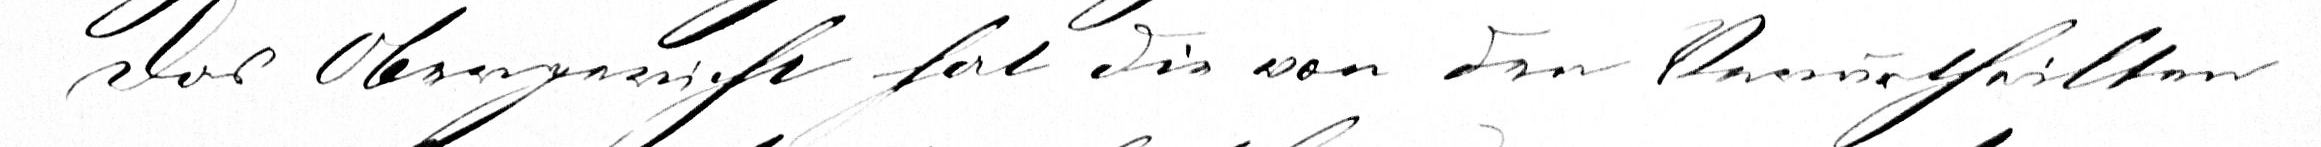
Das Obergericht hat die von den Verurtheilten
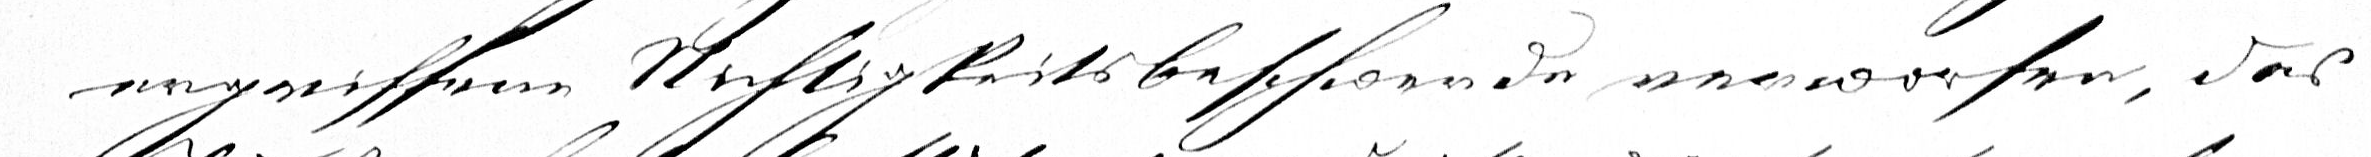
ergriffene Nichtigkeitsbeschwerde verworfen, das
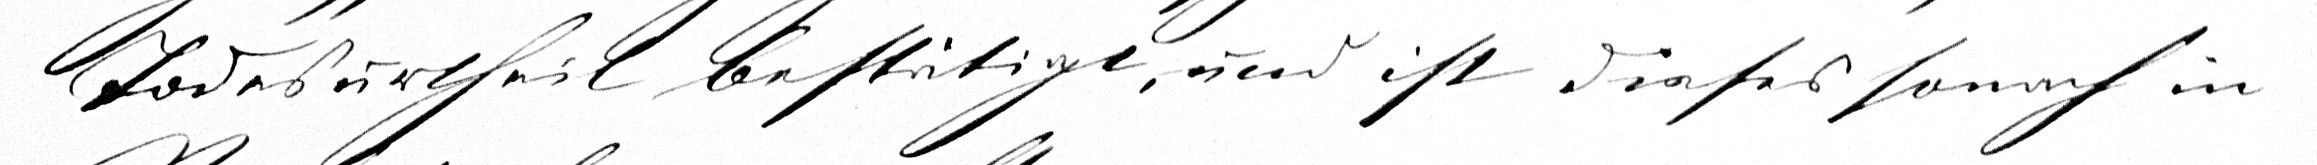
Todesurtheil bestätigt, und ist dieses sonach in
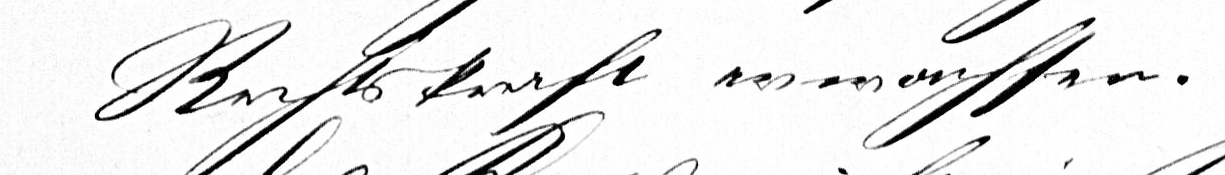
Rechtskraft erwachsen.
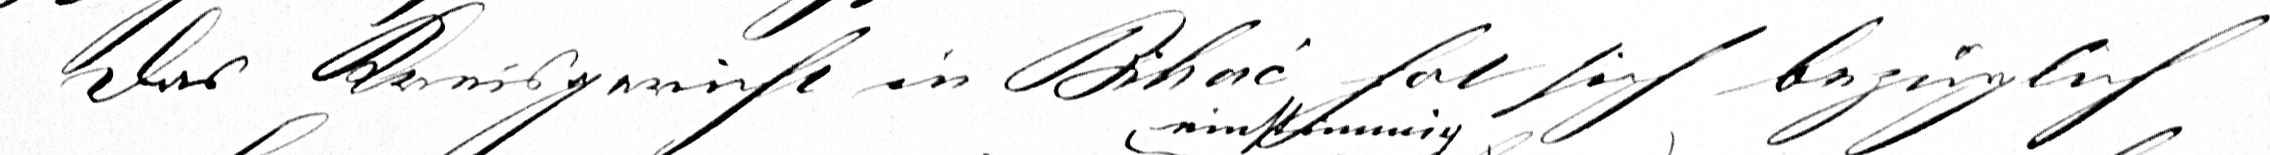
Das Kreisgericht in Bihać hat sich bezüglich
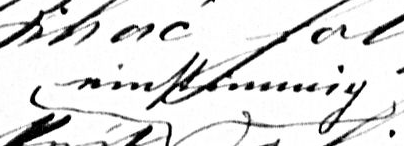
einstimmig
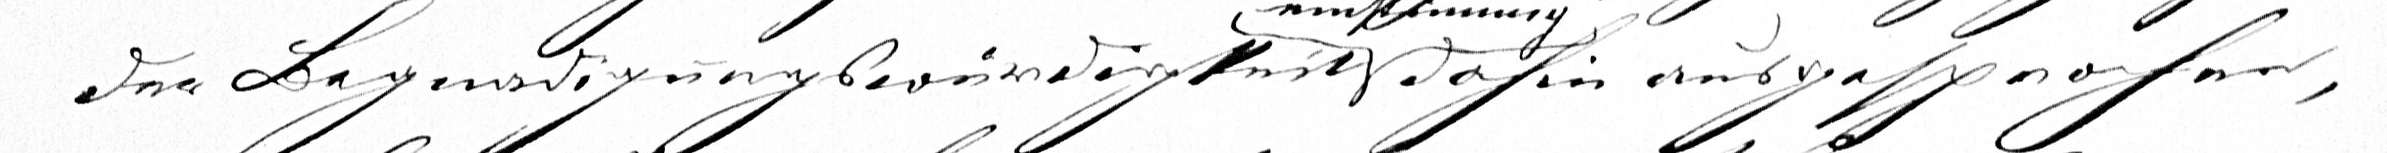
der Benadigungswürdigkeit dahin ausgesprochen,
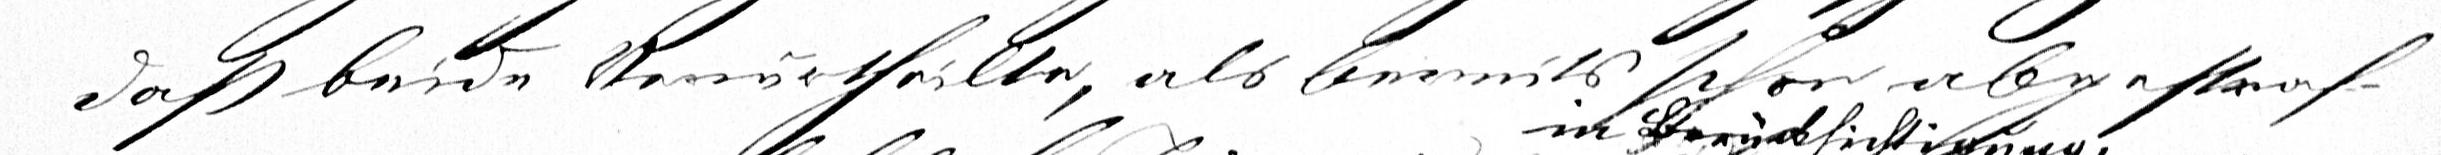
daß beide Verurtheilte, als bereits schon abgestraf¬
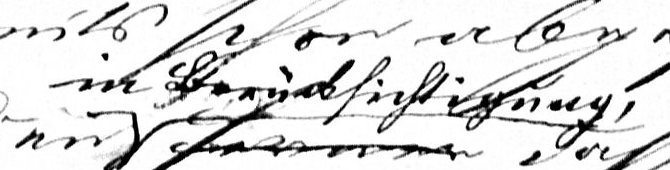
in Berücksichtigung
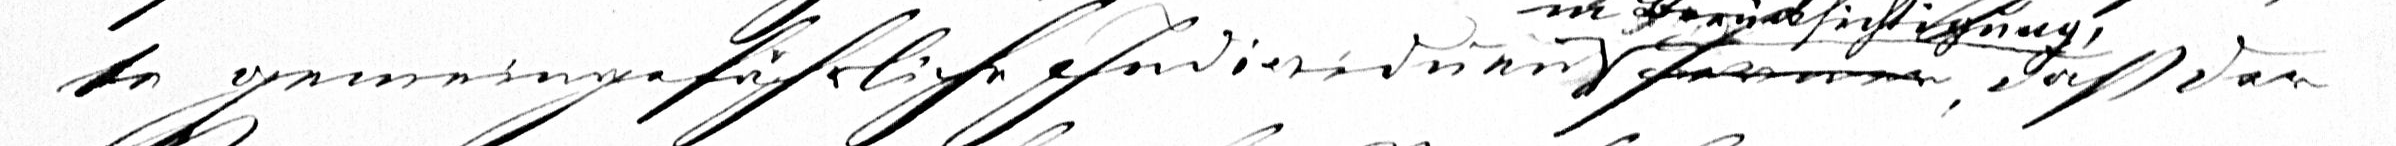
te gemeingefährliche Individuen, daß der
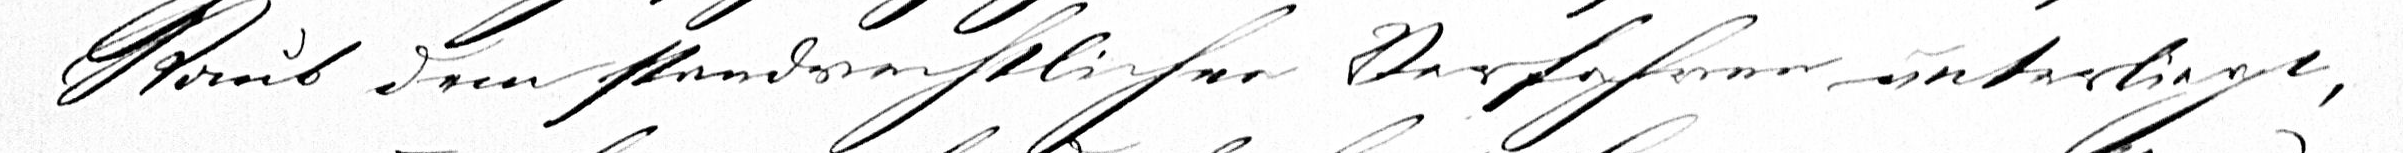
Taub dem standrechtlicher Verfahren unterliegt,
